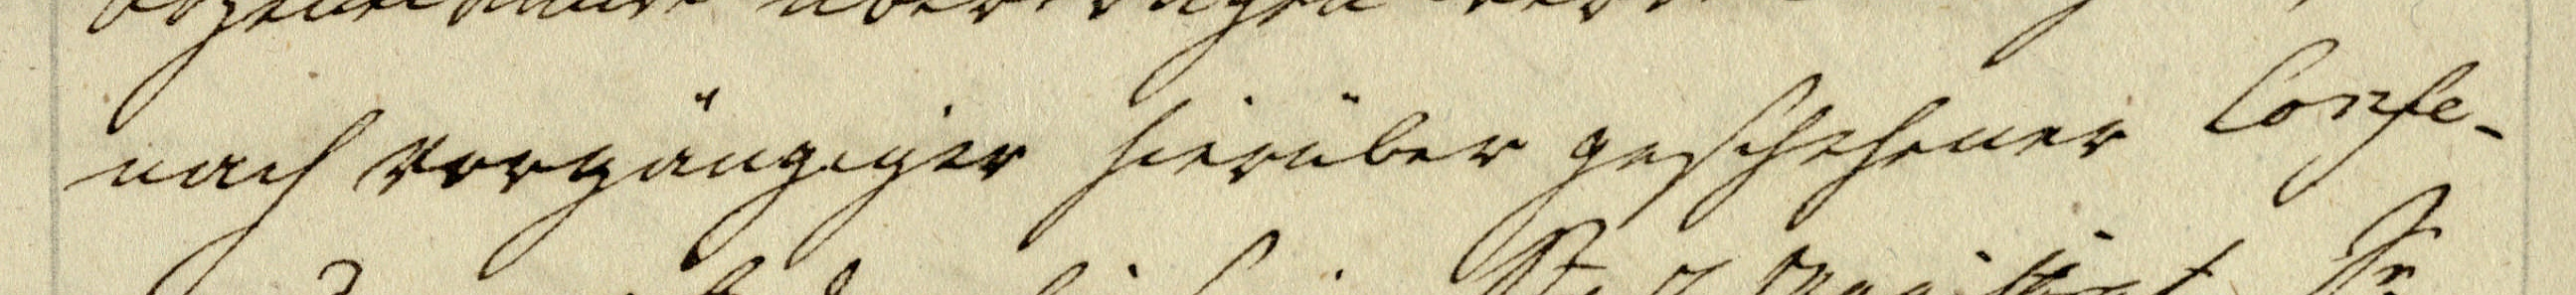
nach vorgängiger hierüber geschehener Confe¬
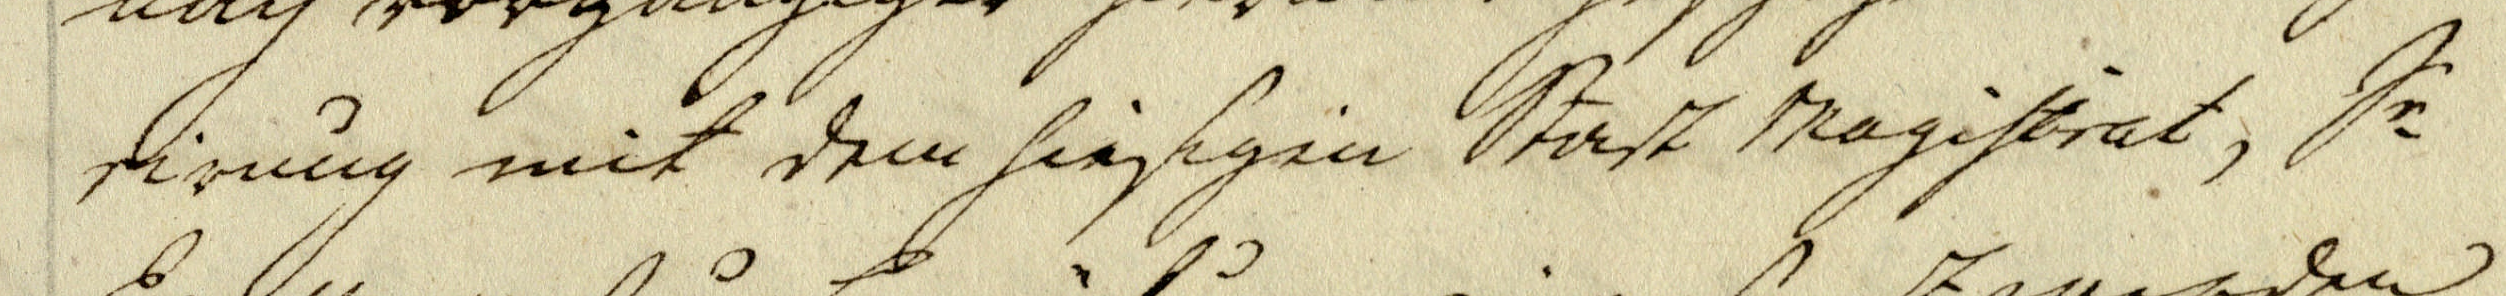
rirung mit dem hiesigen Stadt Magistrat, Sr
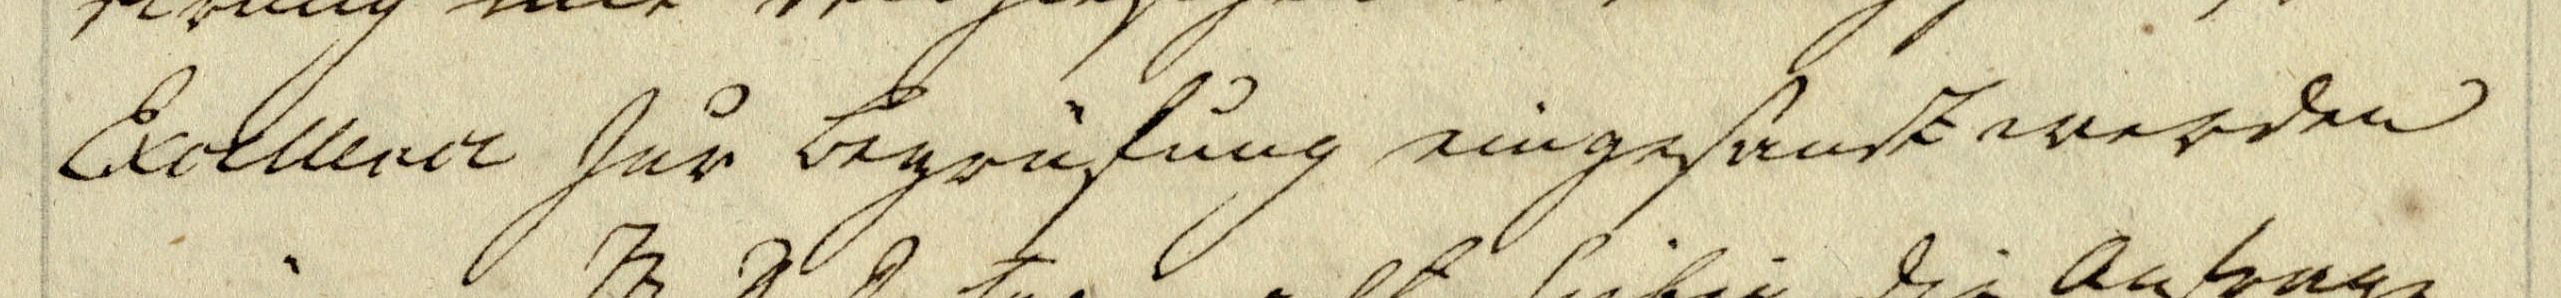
Excellence zur Beprüfung eingesandt werden
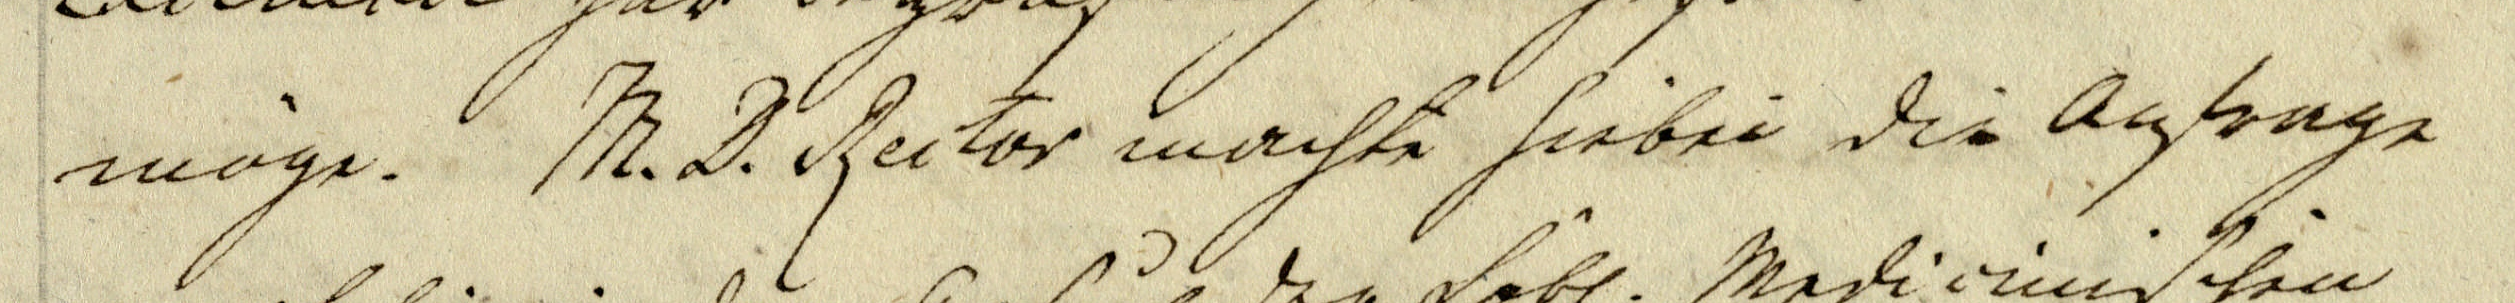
möge. M. D. Rector machte hiebei die Anfrage
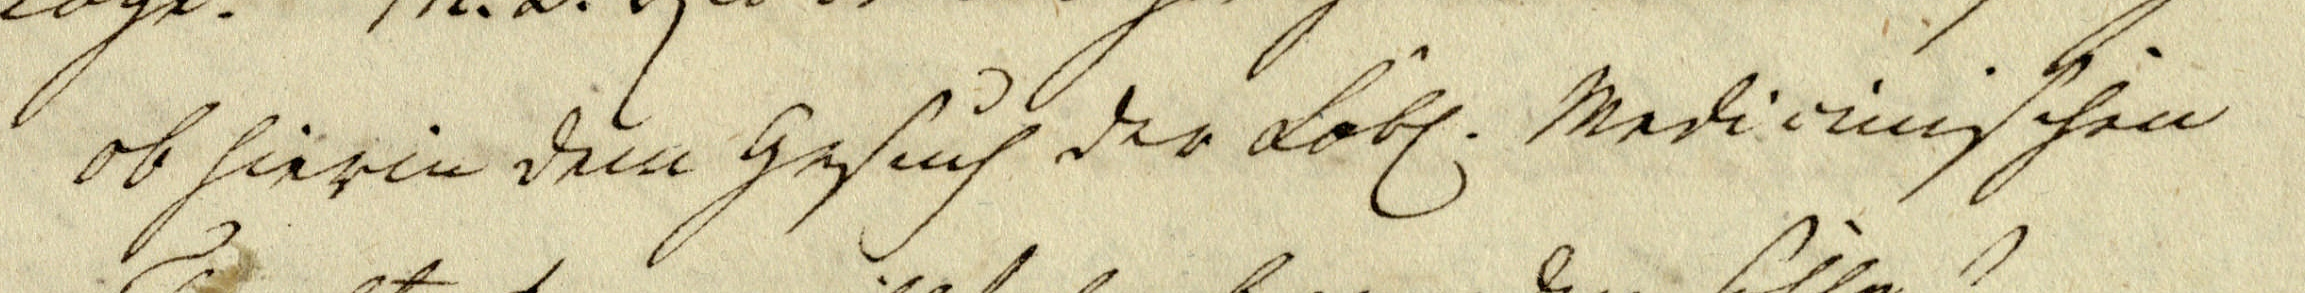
ob hierin dem Gesuch der Löbl. Medicinischen
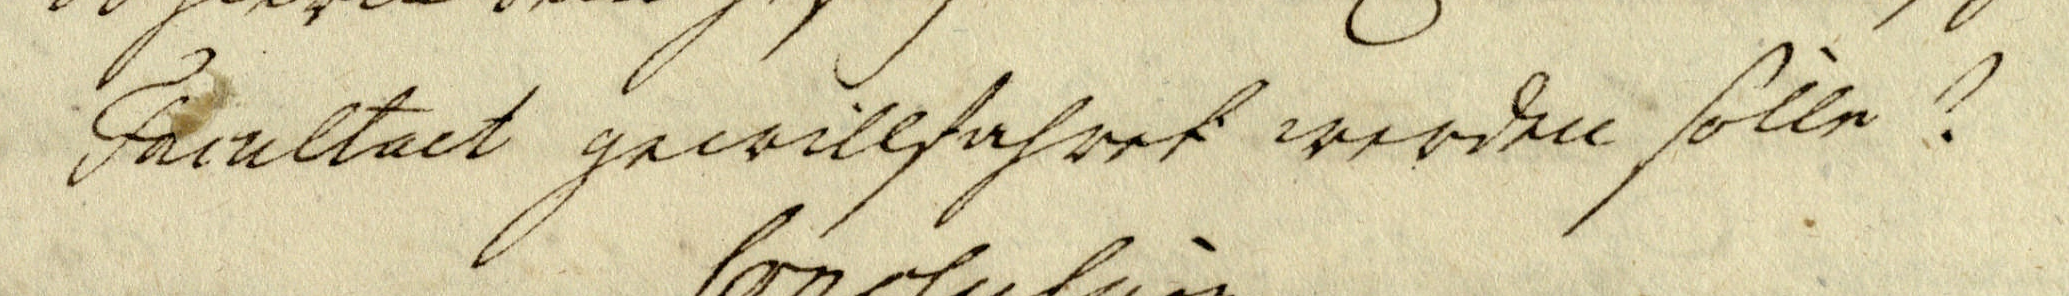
Facultaet gewillfahret werden solle?
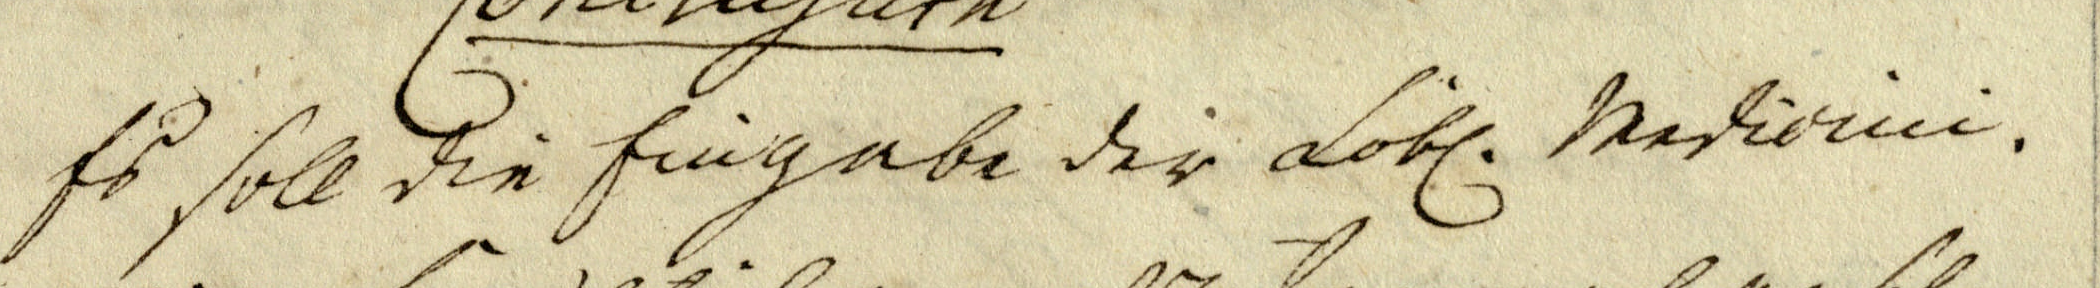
Es soll die Eingabe der Löbl. Medicini¬
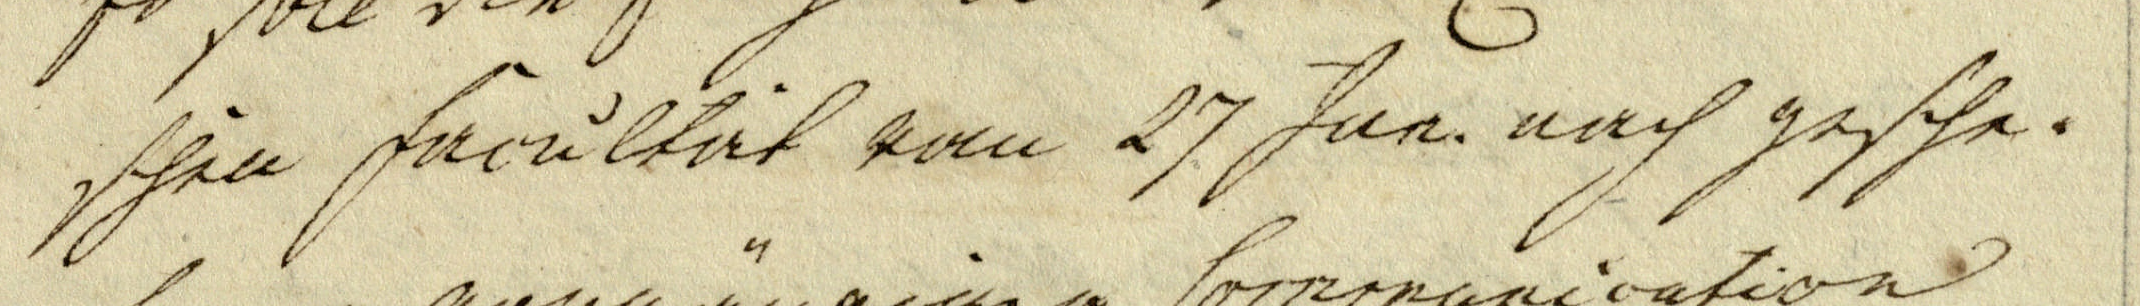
schen Facultät vom 27 Jun nach gesche¬
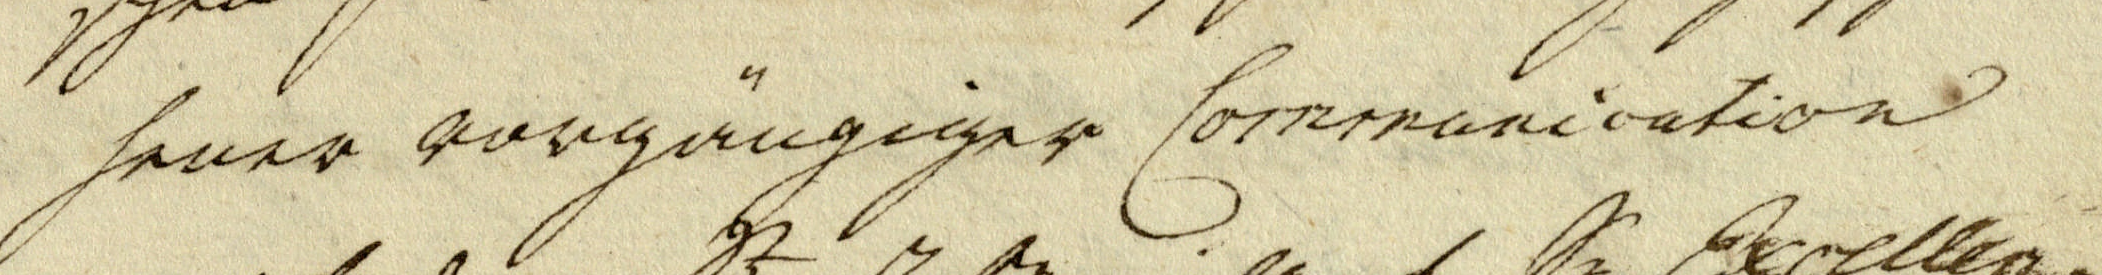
hener vorgängiger Communication
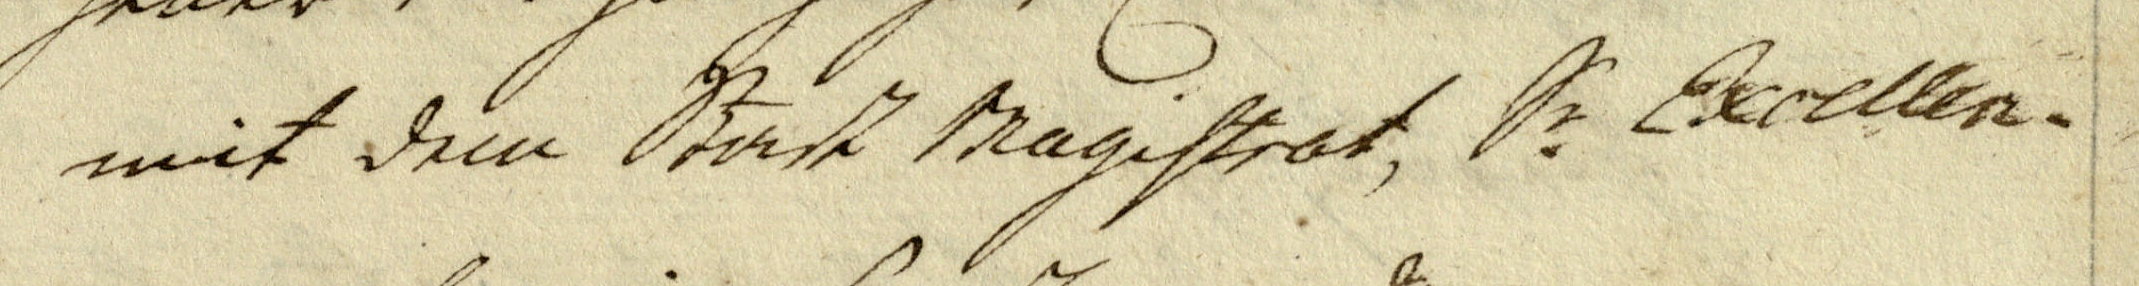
mit dem Stadt Magistrat, Sr Excellen¬
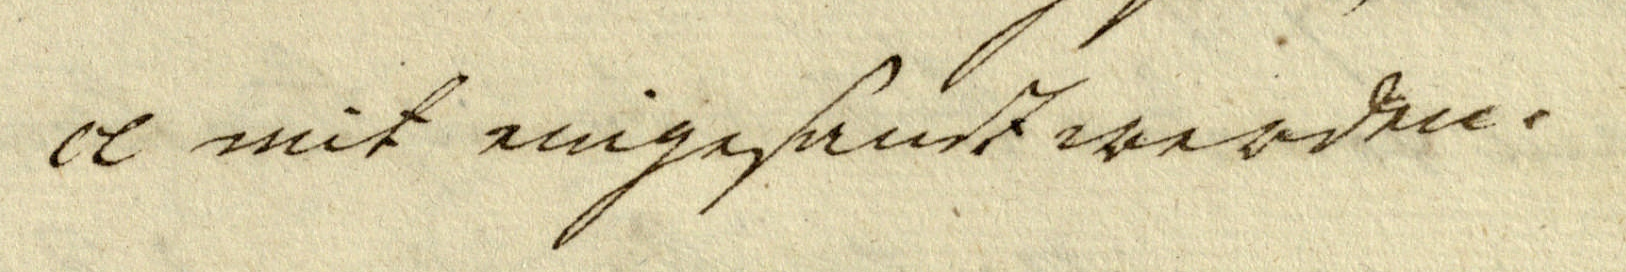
ce mit eingesandt werden.
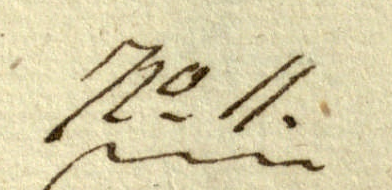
No 11.
